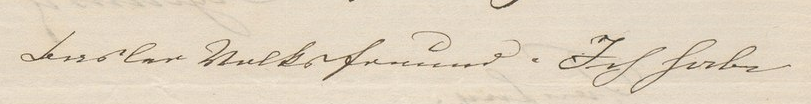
Basler Volksfreund. Ich habe
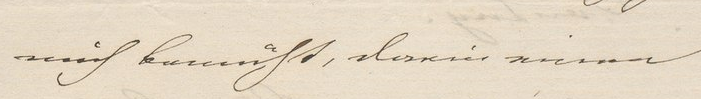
mich bemüht, darin einen
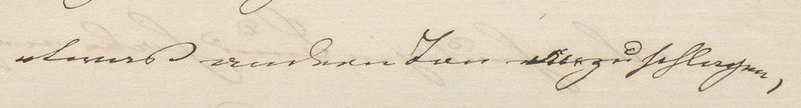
etwas andern Ton anzuschlagen,
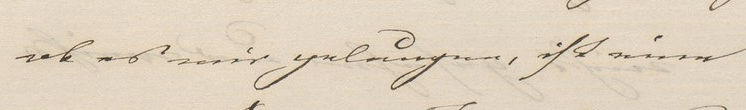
ob es mir gelungen, ist eine
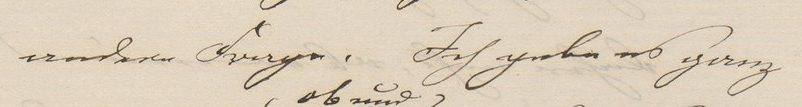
andere Frage. Ich gebe es ganz
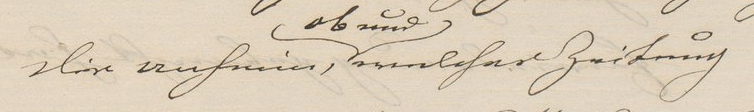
Dir anheim, ob und welcher Zeitung
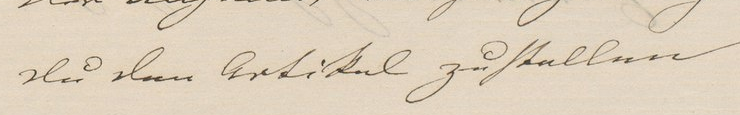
Du den Artikel zustellen
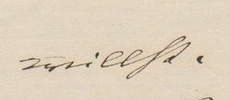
willst.
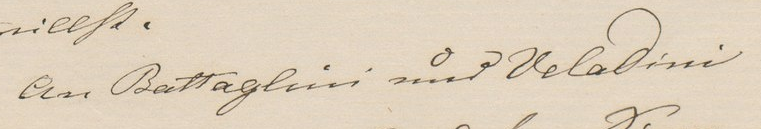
An Battaglini und Veladini
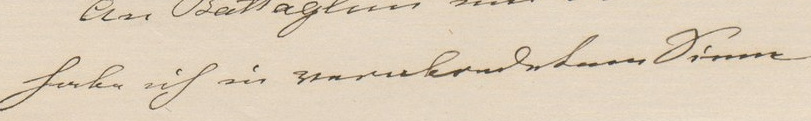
habe ich in verabredetem Sinne
